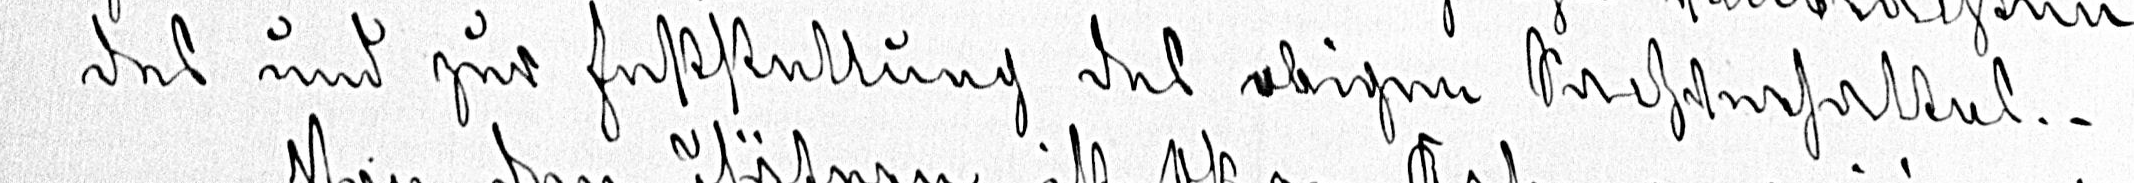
des und zur Feststellung des obigen Sachverhaltes.-
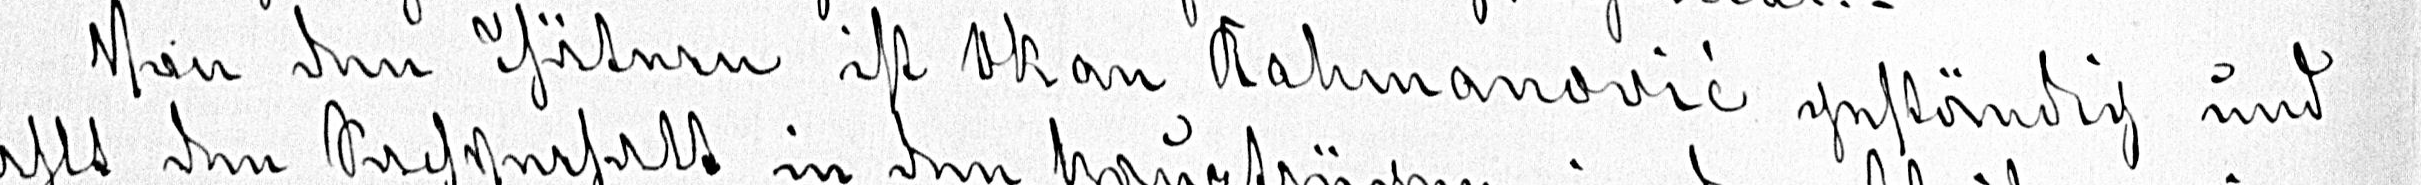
Von den Thätern ist Okan Rahmanović geständig und
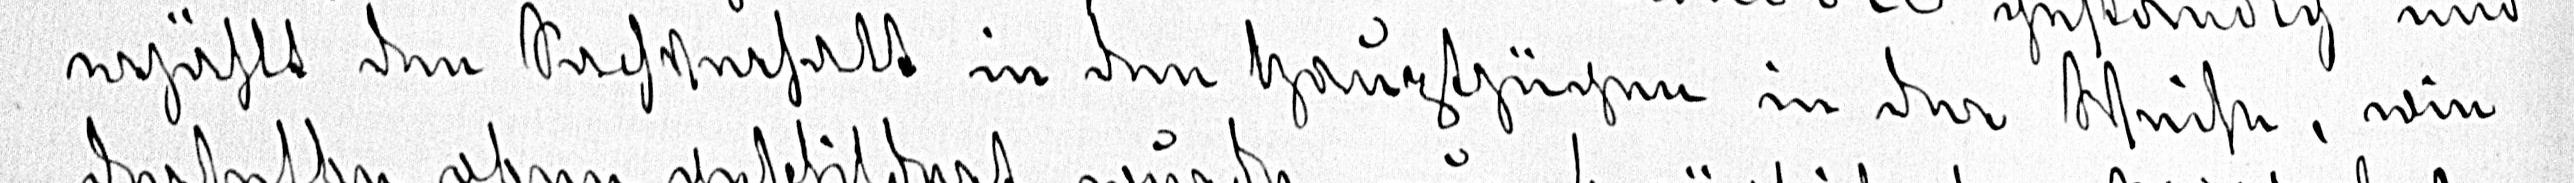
erzählt den Sachverhalt in den Hauptzügen in der Weise, wie
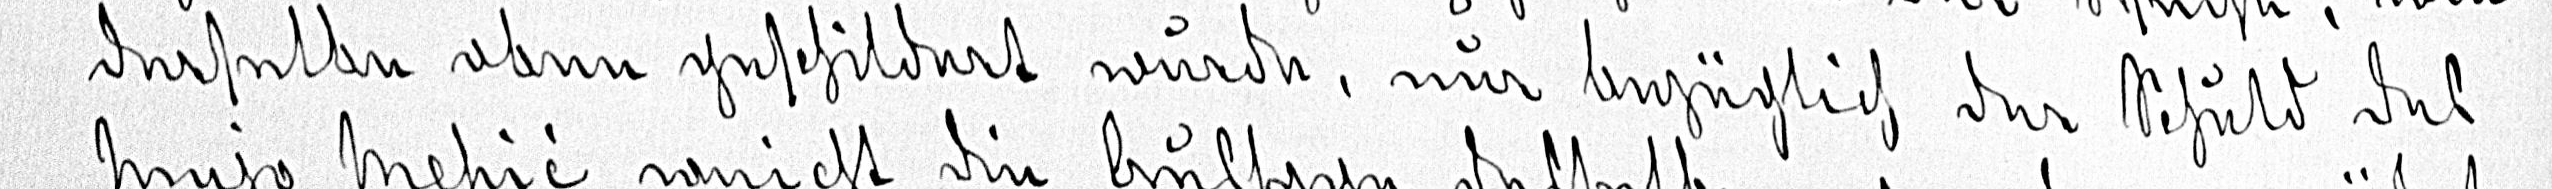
derselbe oben geschildert wurde, nur bezüglich der Schuld des
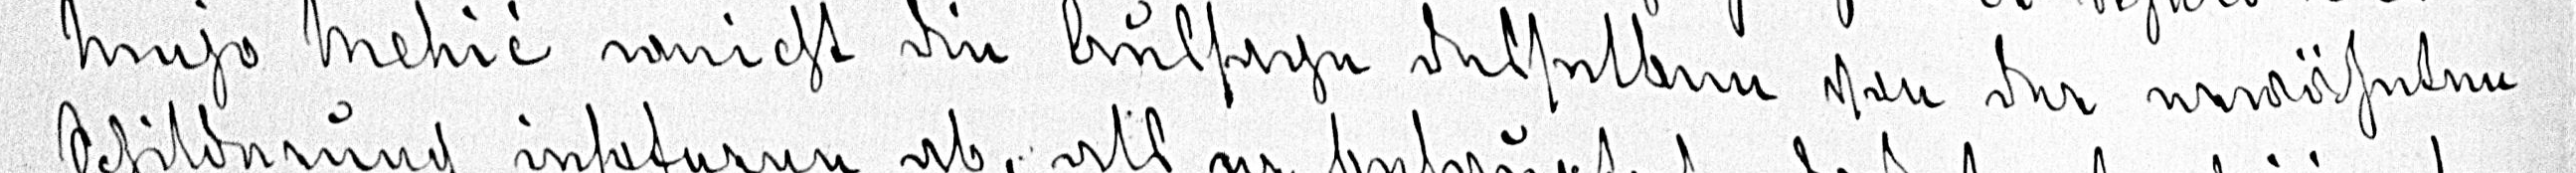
Mujo Mehić weicht die Aussage desselben von der erwähnten
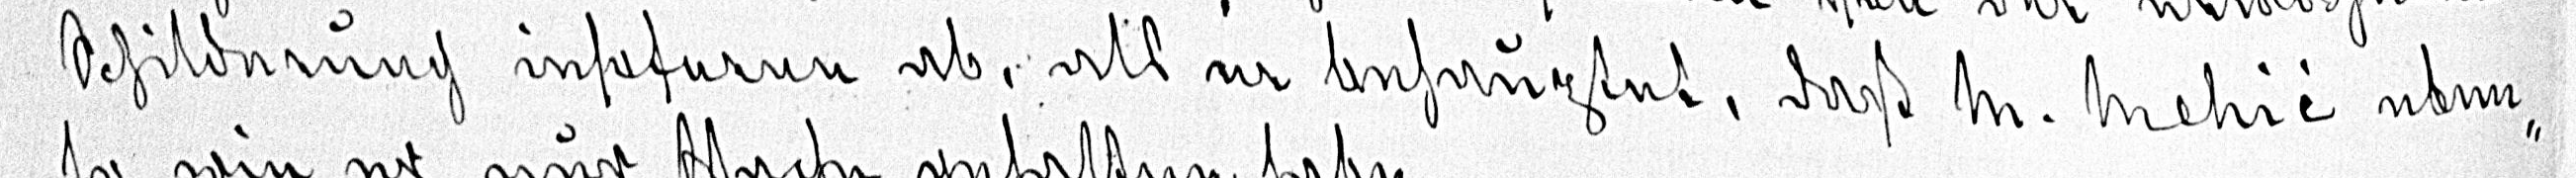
Schilderung insoferen ab, als er behauptet, daß M. Mehić eben¬
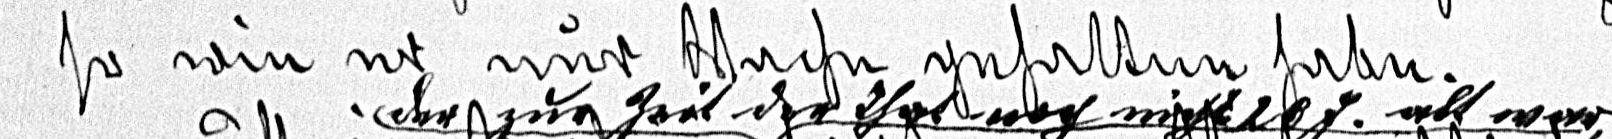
so wie er nur Wache gehalten habe.
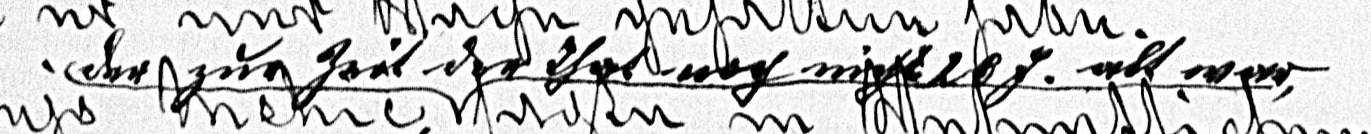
der zur Zeit der That noch icht 20 J. alt war,
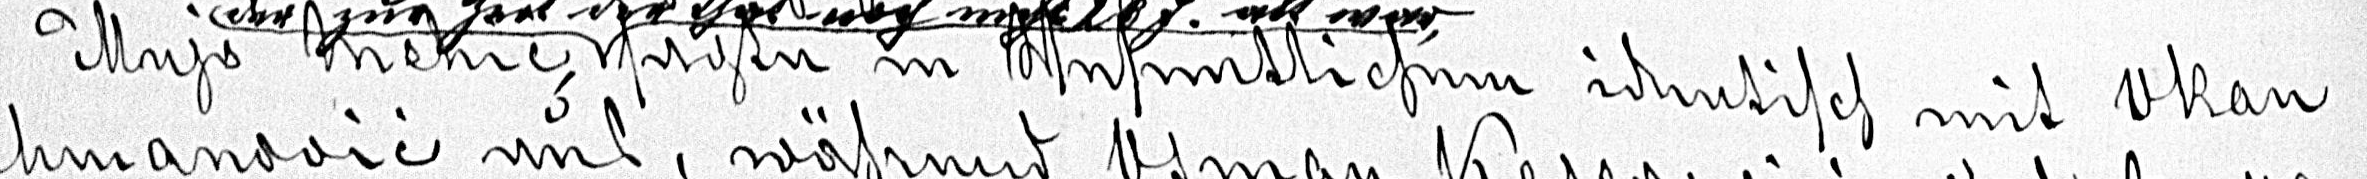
Mujo Mehić sagte in Wesentlichem identisch mit Okan
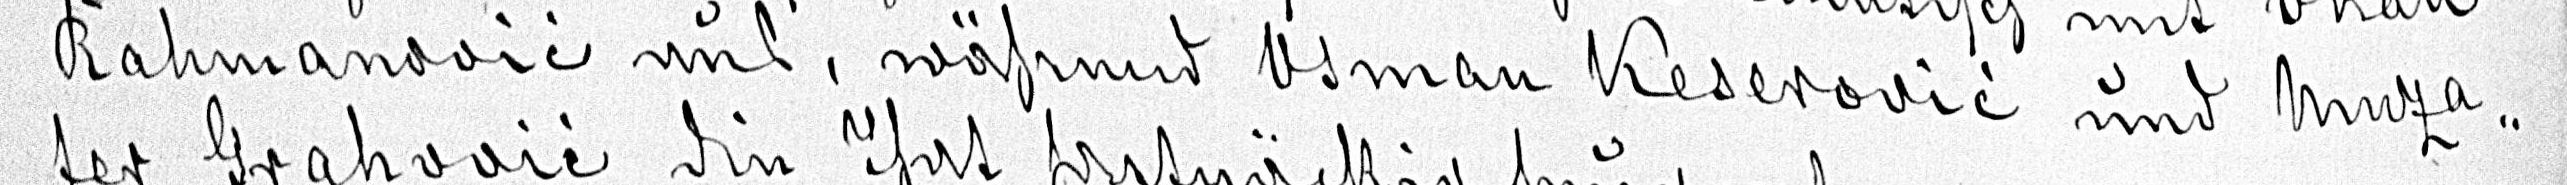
Rahmanović aus, während Osman Keserović und Muza¬
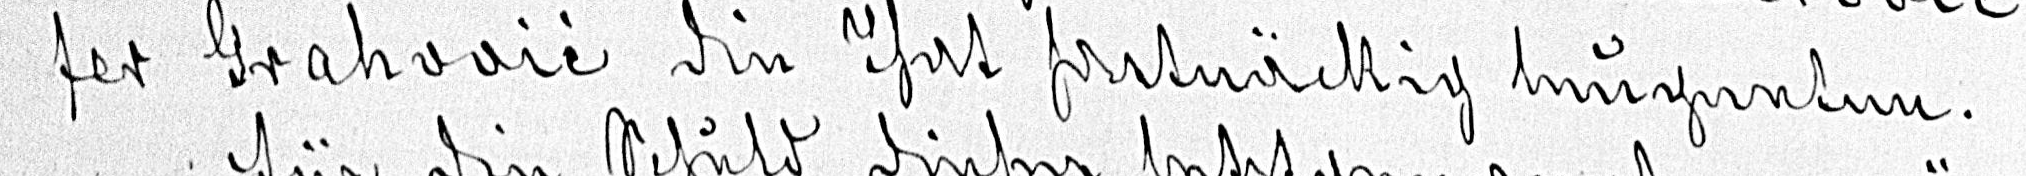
fer Grahović die That hartnäckig leugneten.
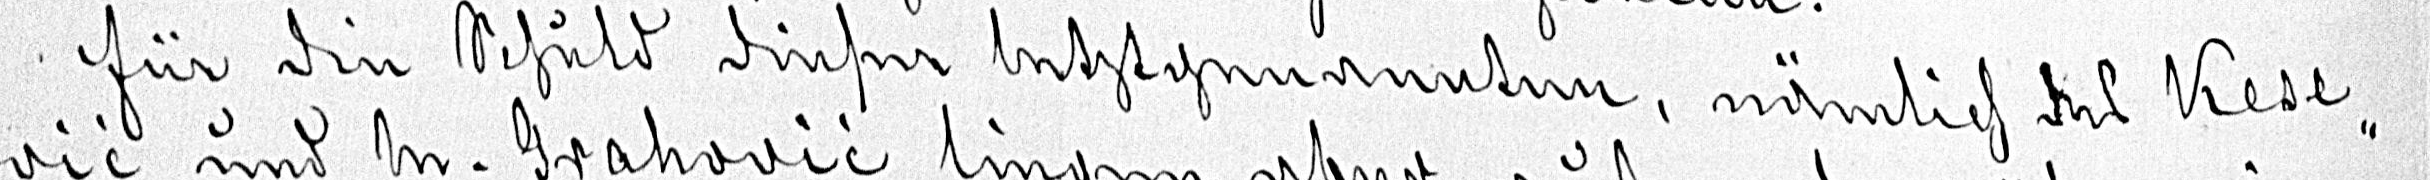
Für die Schuld dieser letztgenannten, nämlich des Kese¬
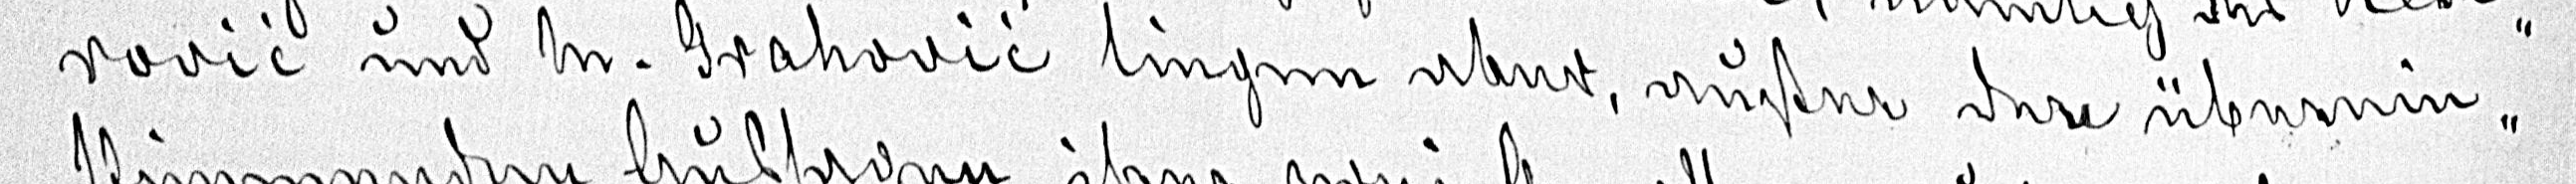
rović und M. Grahović liegen aber, außer den überein¬
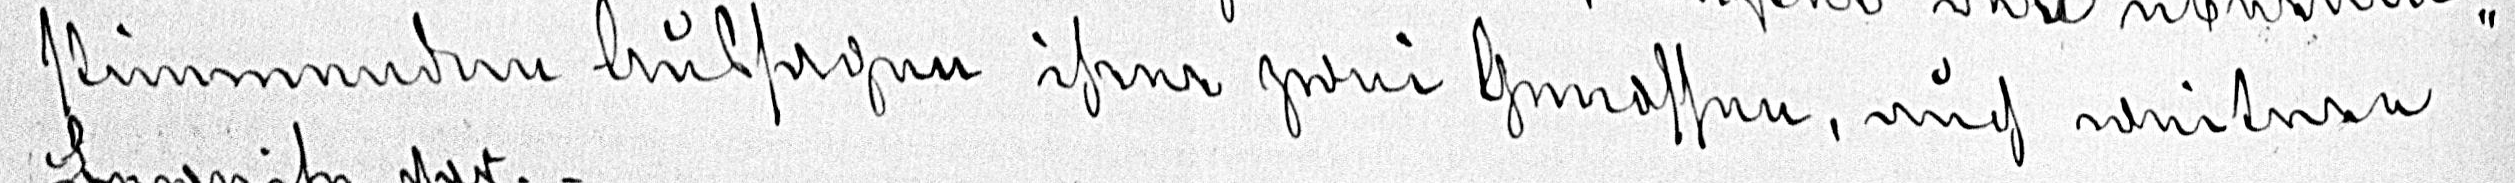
stimmenden Aussagen ihrer zwei Genossen, auch weitere
